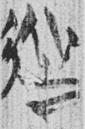○（過）
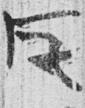厇（度）
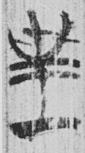皇
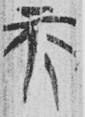天
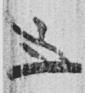之
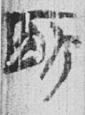所
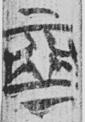亞（惡）
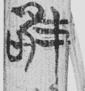唯（雖）
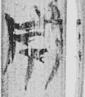成
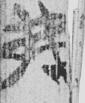弗
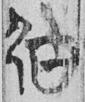居
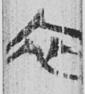衣
